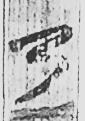乃
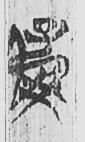{人呆爻}
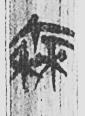秦
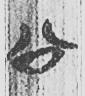公
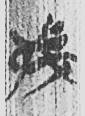弗
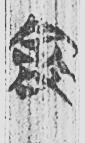{余又}
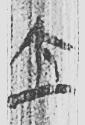立
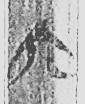六
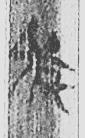年
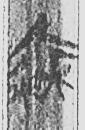秦
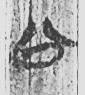公
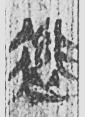{行幺止}
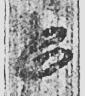𠂤
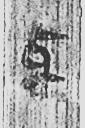與
